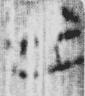心
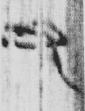又
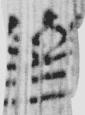爲
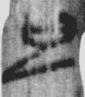也
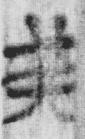弗
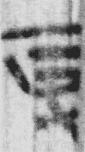○（得）
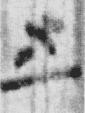之
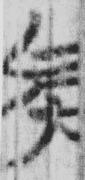矣
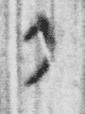人
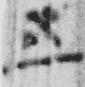之
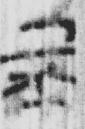不
